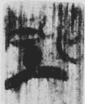城
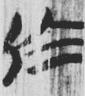於
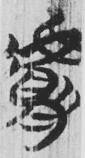膚
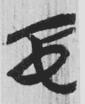𠁩
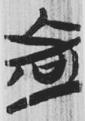者
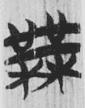無
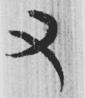又（有）
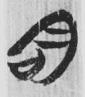名
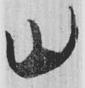山
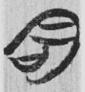名
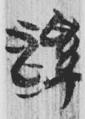溪
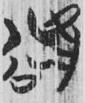欲
